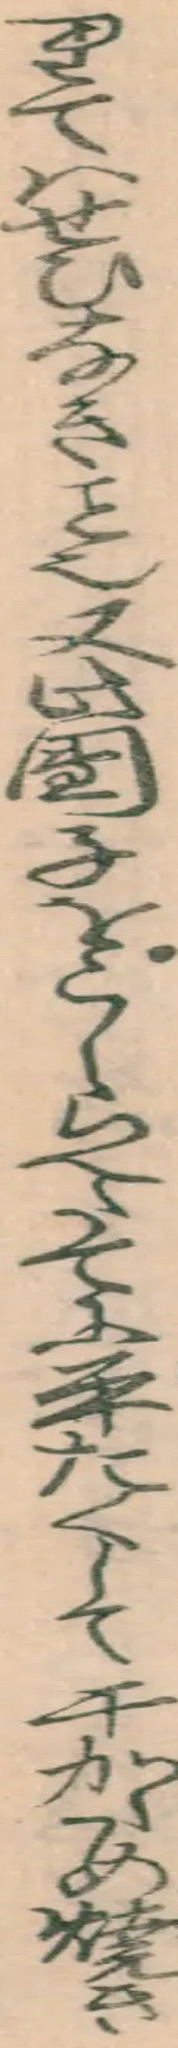りてはせひなきこと也又此団子を．こしらへたてに平たくして干かため．焼き
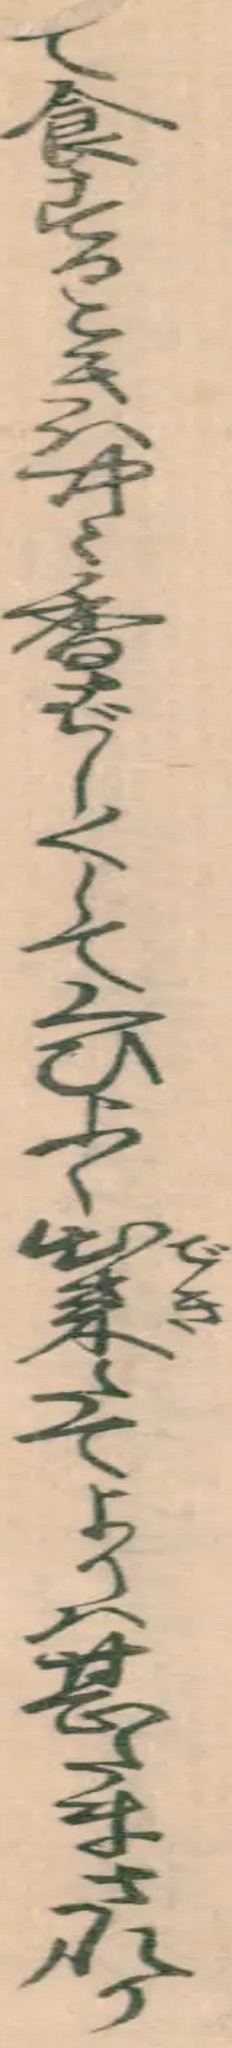て食するときは中々香ばしくしてくひよく出来たてよりは甚たまされり
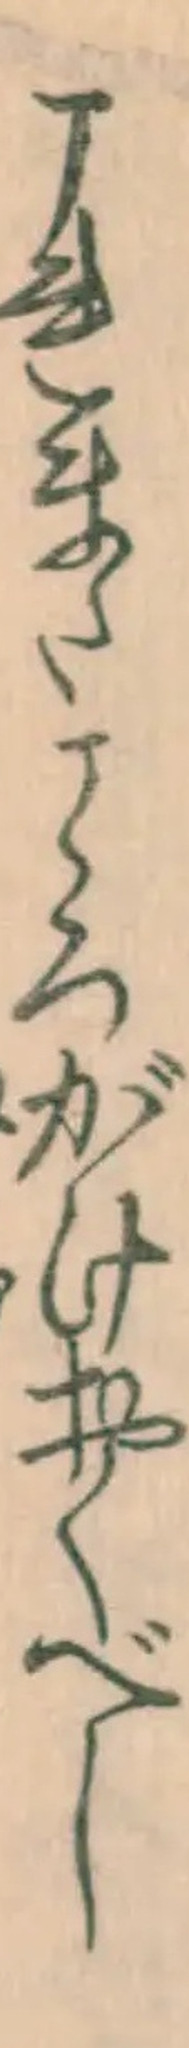これまたこゝろがけおくべし
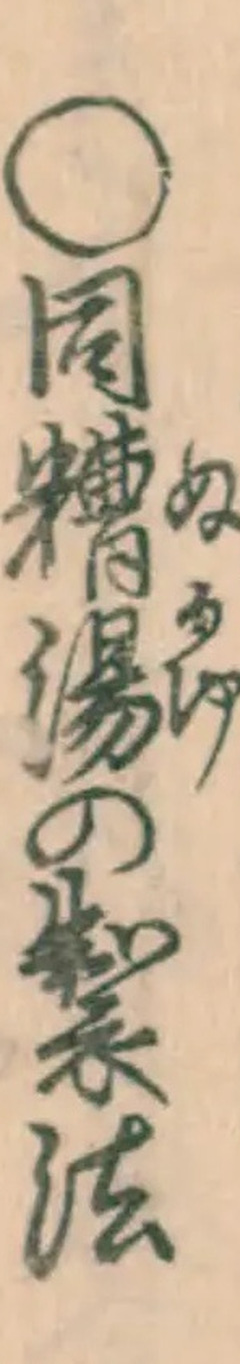○同糟湯の製法
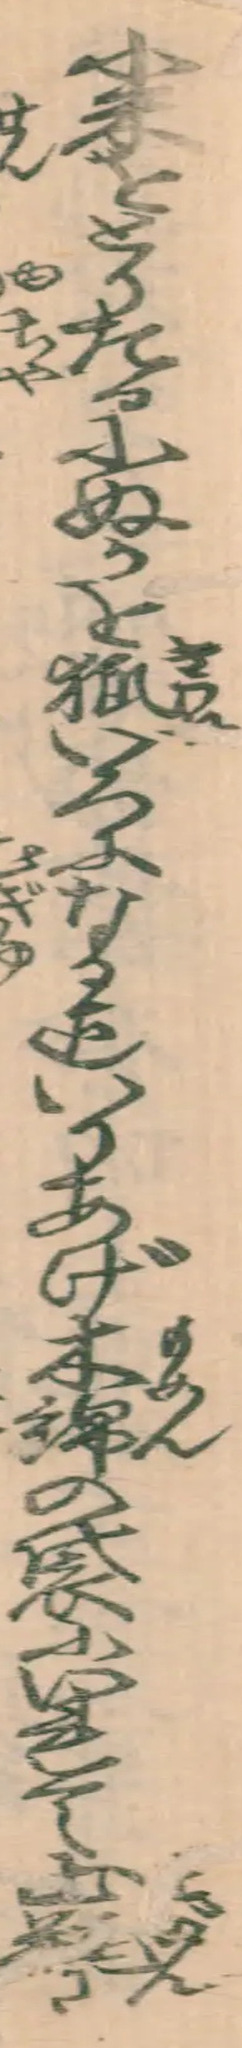小米をとりたる小ぬかを狐いろになる迄いりあげ木綿の袋にいれて土瓶に
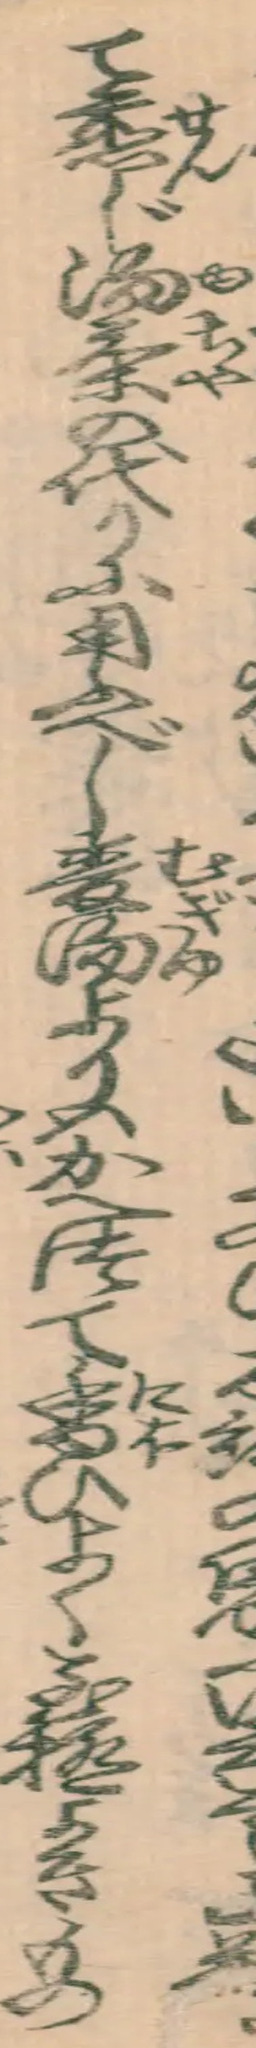て煎じ湯茶の代りに用ふべし麦湯よりはかへつて香ひよく至極よきもの
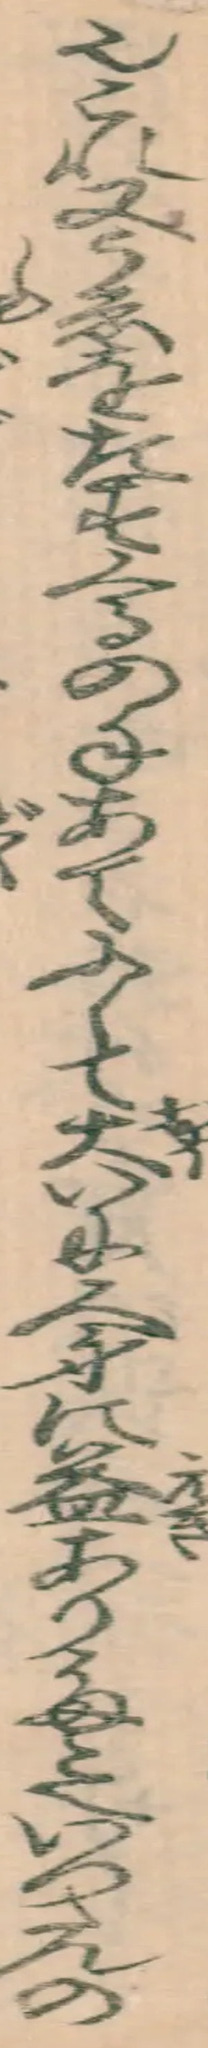也これ又うゑをたすくるの手あてにして大いに人身に益ありたとへいつたんの
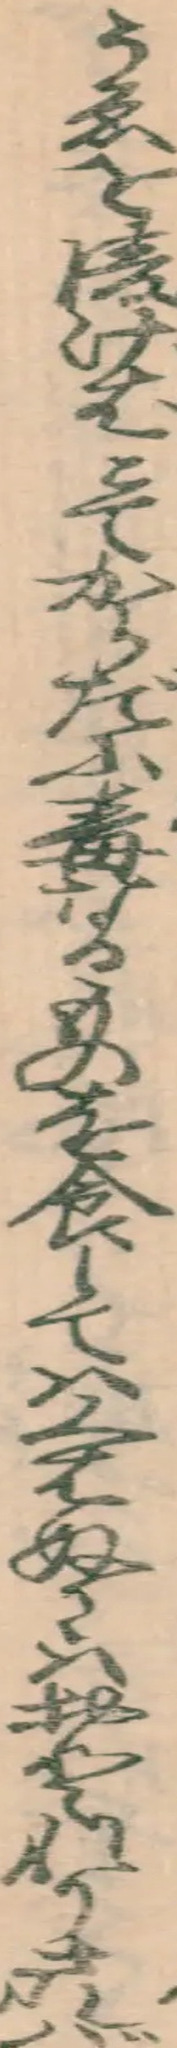うゑを凌げばとてからだに毒なるものを食してはくはぬにはおとれりされば
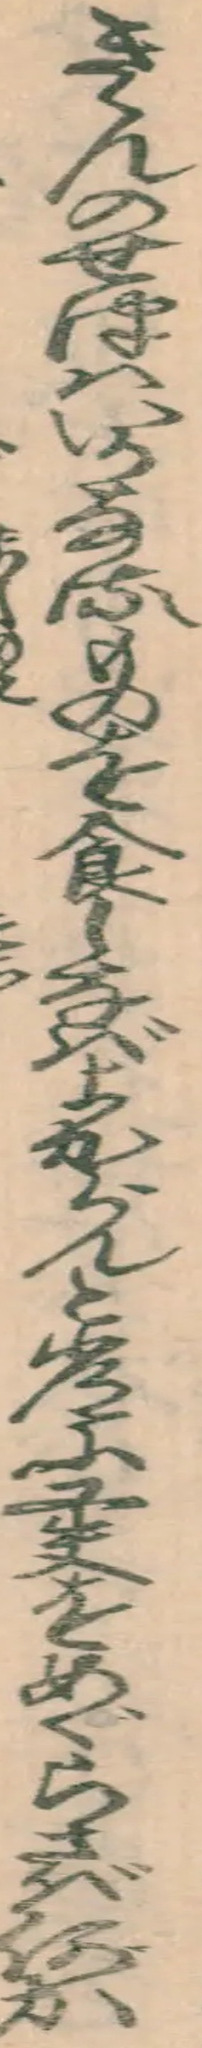きゝんのせつはいかなるものを食しなばよからんと常に工夫をめぐらさば何か
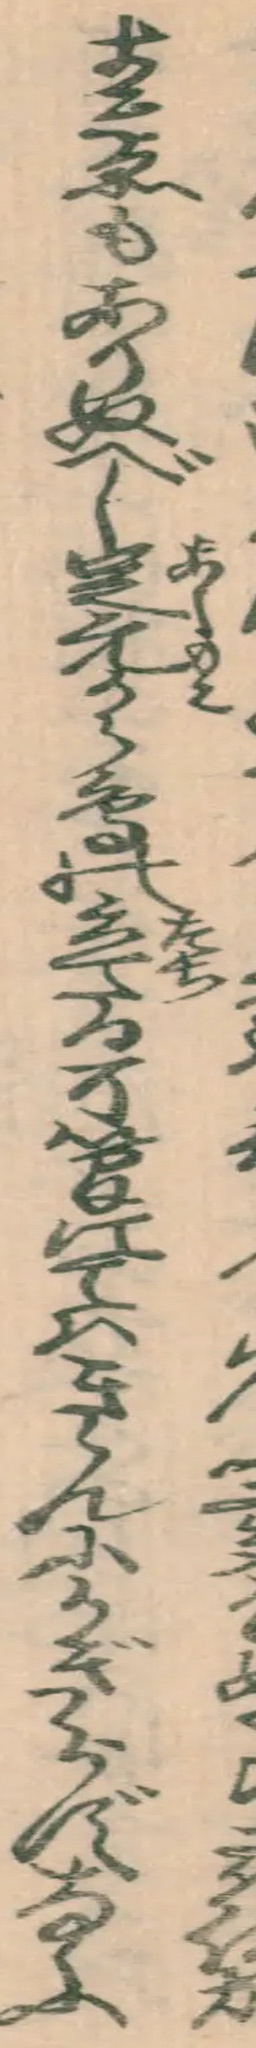よき品もありぬべし足元から鳥の立たる了簡にてはきゝんにかぎらずなに
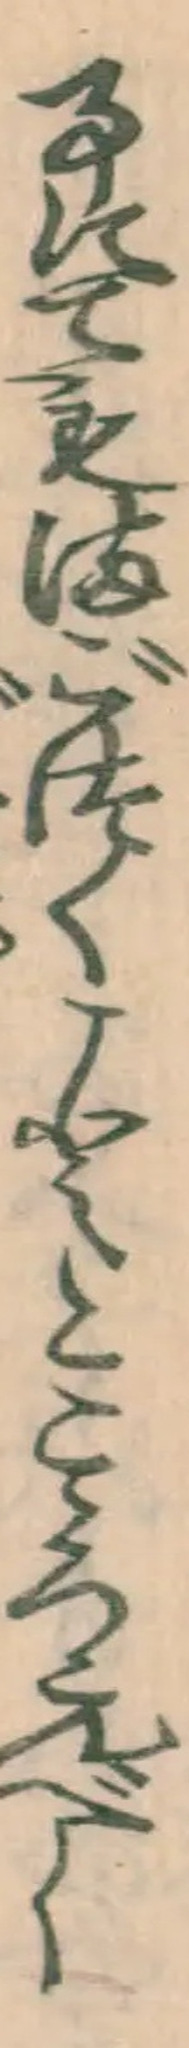事にてもまごつくこととこゝろえべし
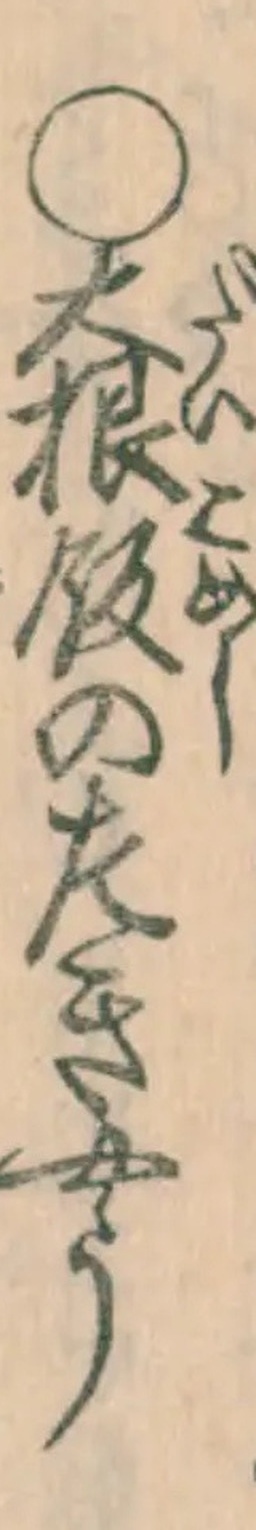○大根飯のたきやう
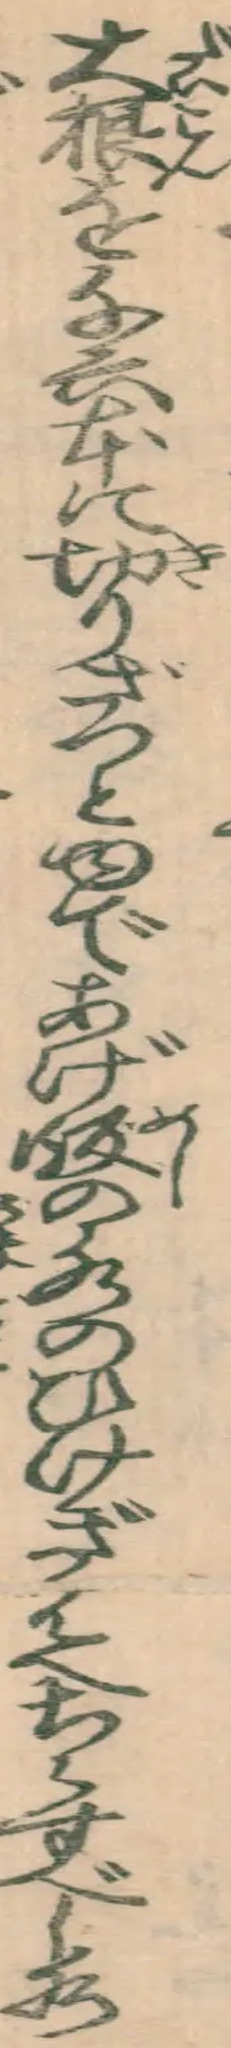大根を千六本に切りざつとゆであげ飯の水のひけぎはへちらすべし水
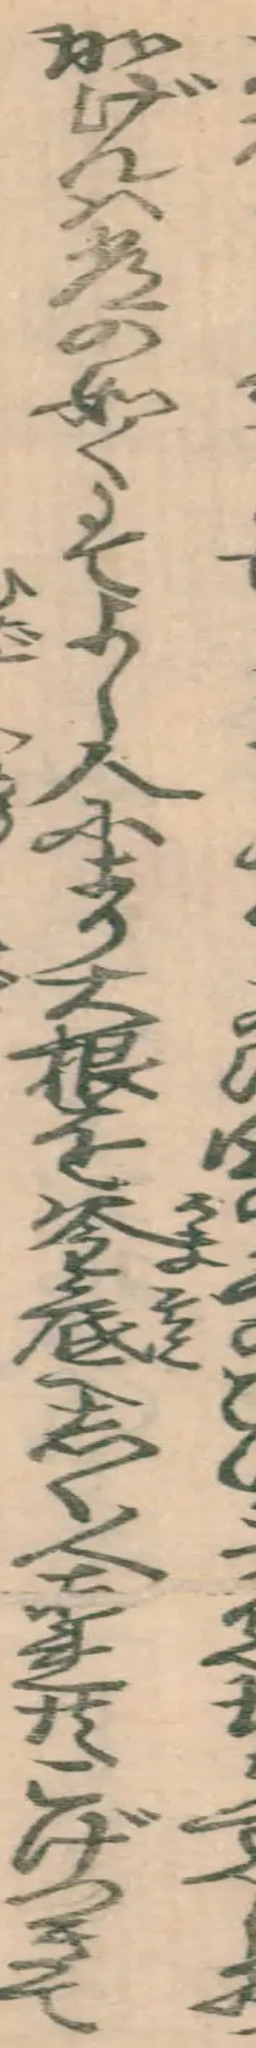かげんは常の如くにてよし人により大根を釜底へしく人あれ共こげつきて
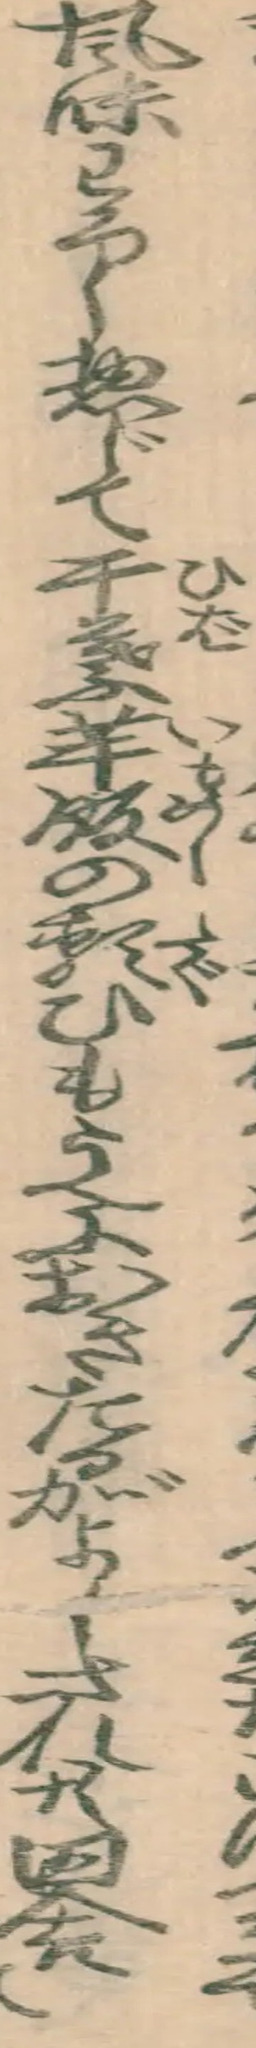風味わろく惣じて干葉芋飯の類ひもうへにおきたるがよしされ共田舎にて
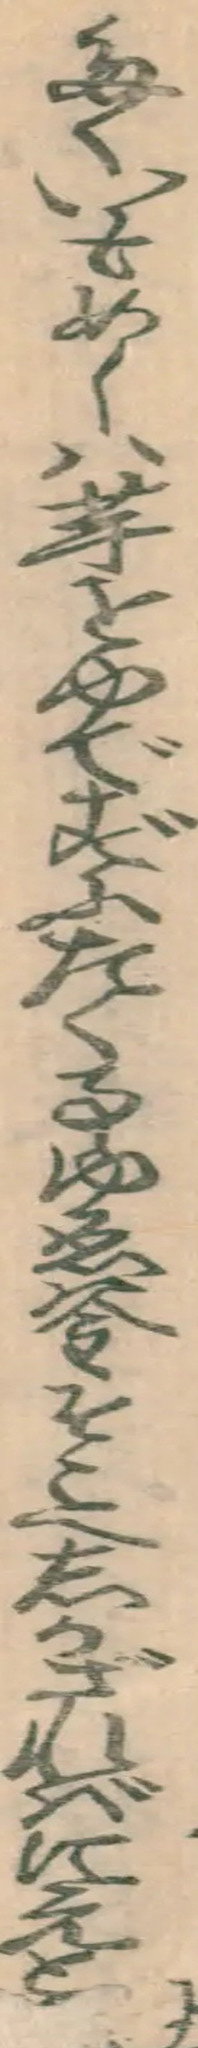たくいもめしは芋をゆでずにたく事ゆゑ釜そこへしかざればにえとほ
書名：日ごとの心得
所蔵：国立国会図書館 National Diet Library, JAPAN
